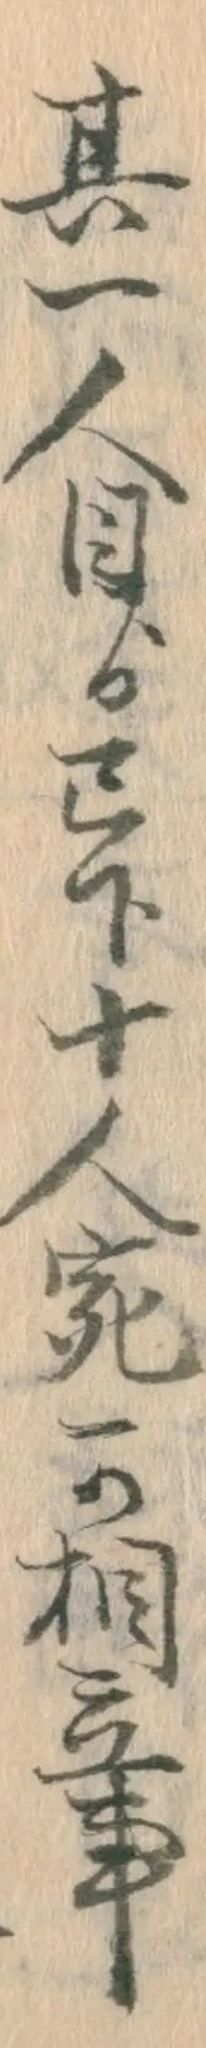其一人目ゟ已下十人宛可相立事
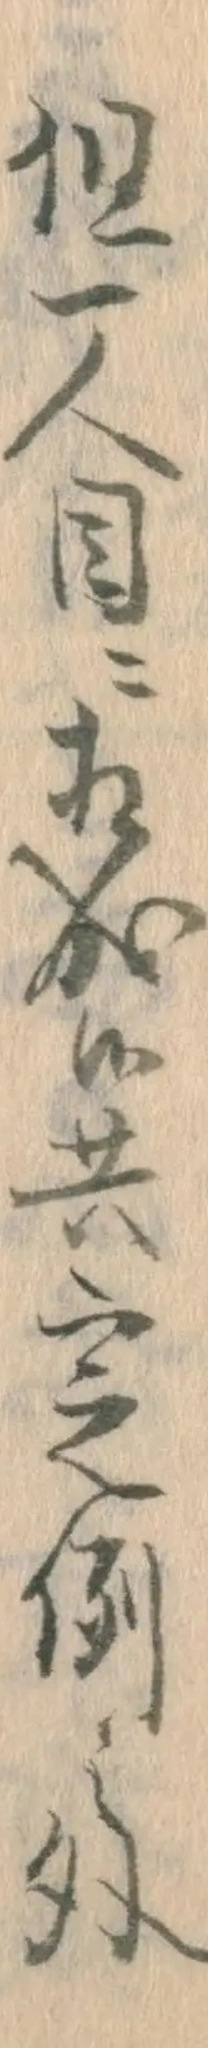但一人目ニ相成候共定例之外
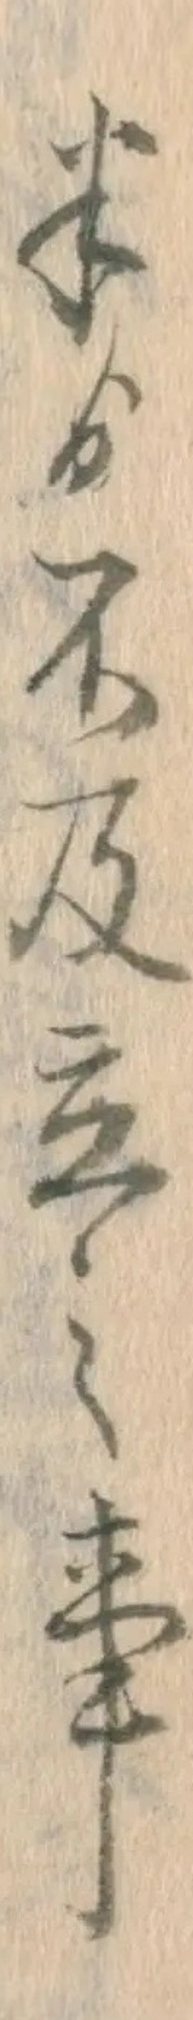半ゟ不及立之事
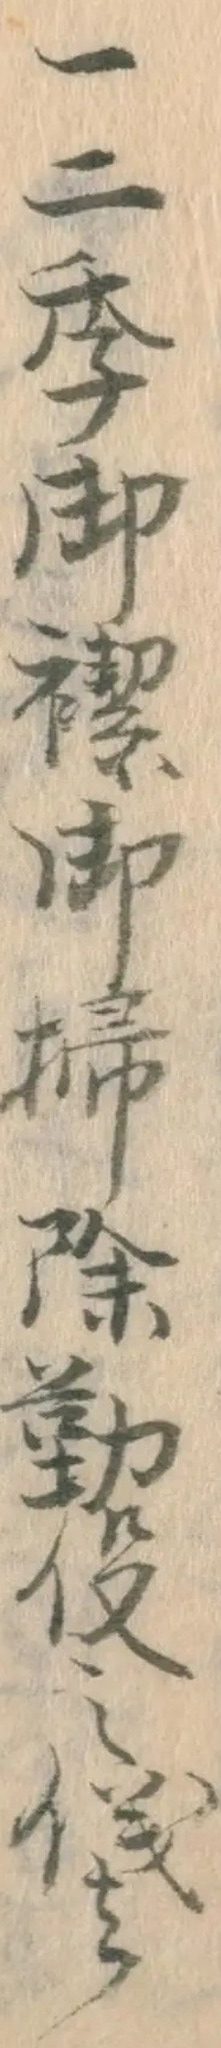一二季御褉御掃除勤役之儀は
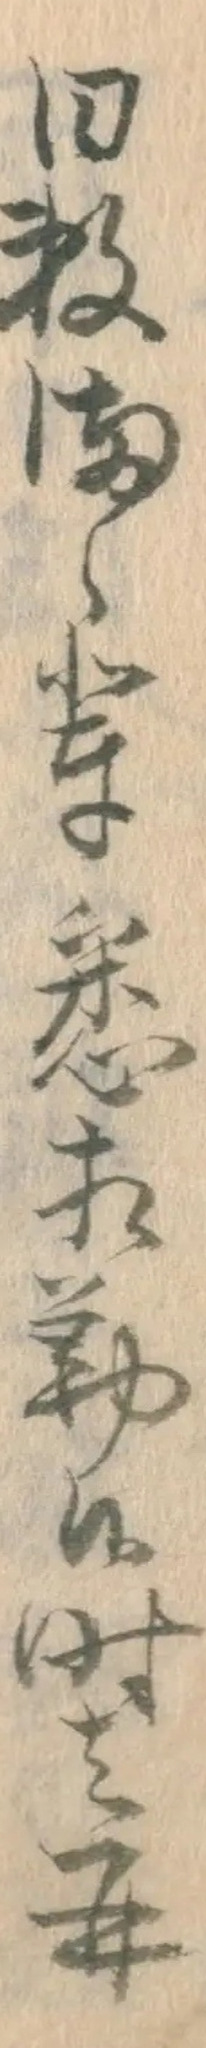日数満之輩悉相勤候時は再
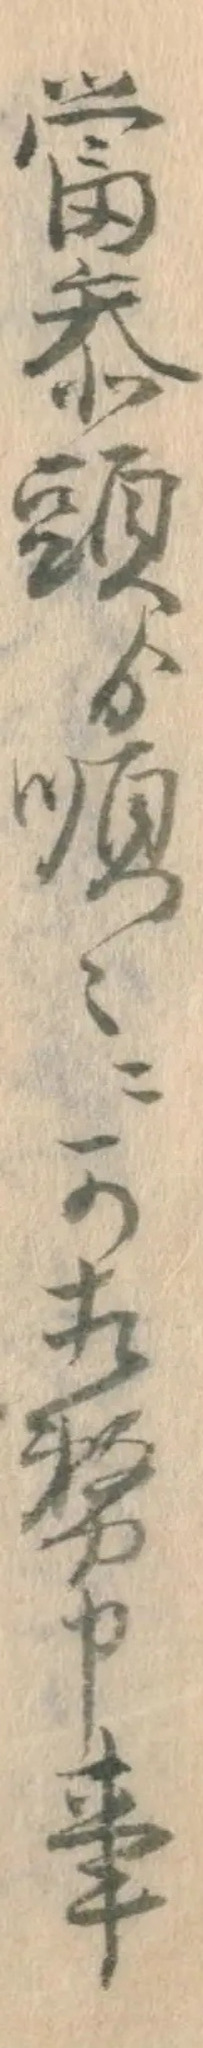當参頭ゟ順々に可相務申事
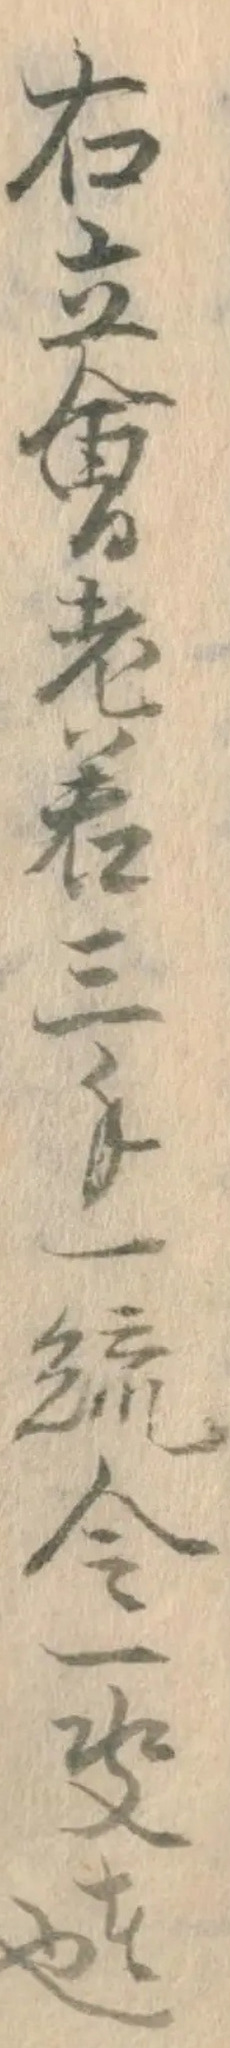右立會老若三手一統令一決者也
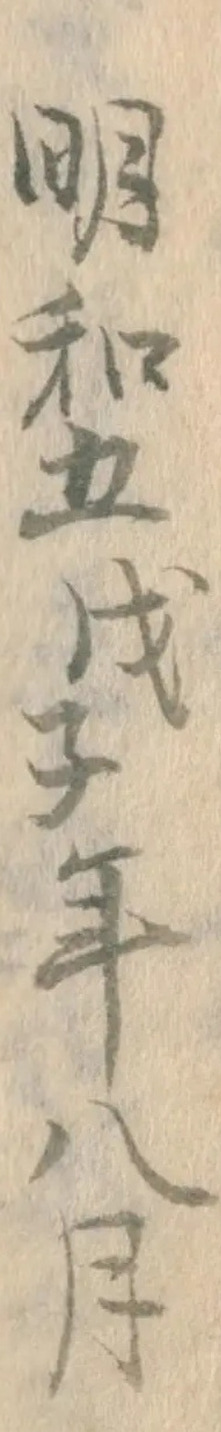明和五戊子年八月

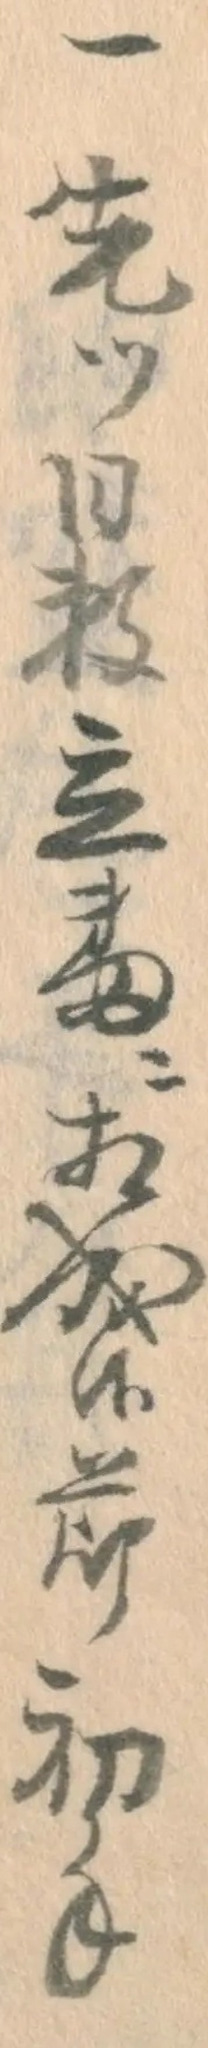一先ツ日数立番ニ相成候節初手
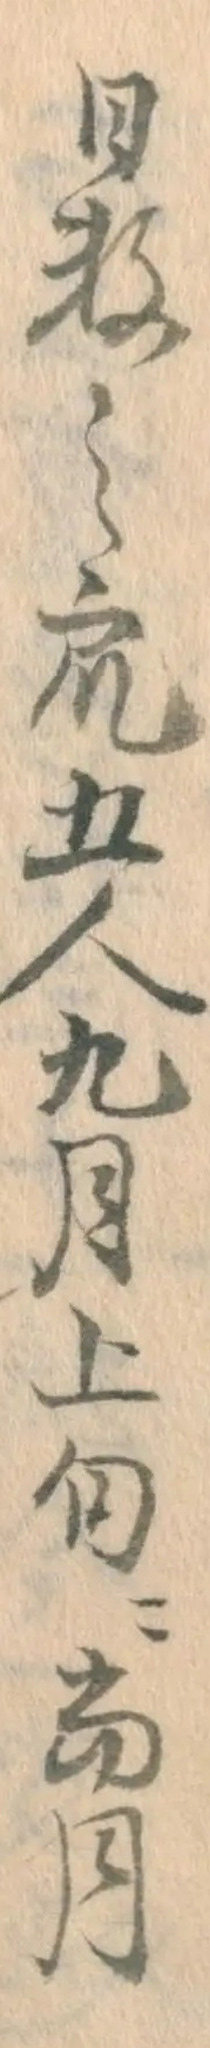日数之衆五人九月上旬二當月
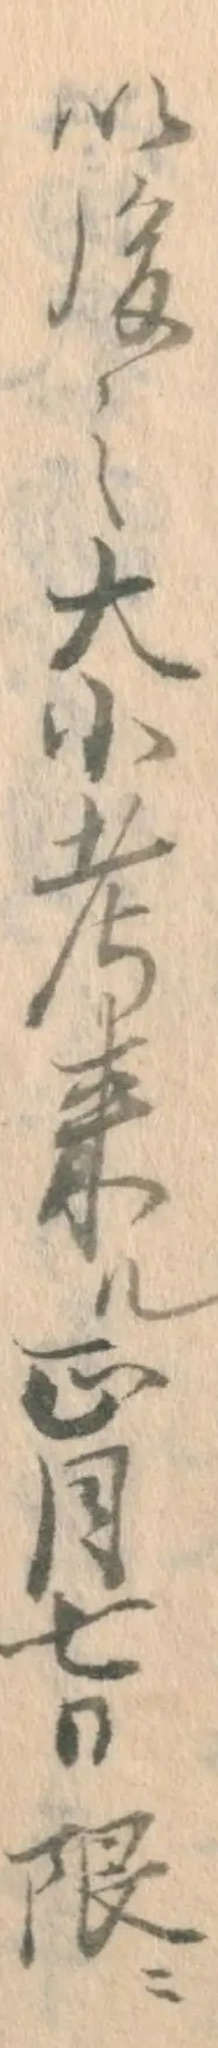以後之大小考来ル正月七日限ニ
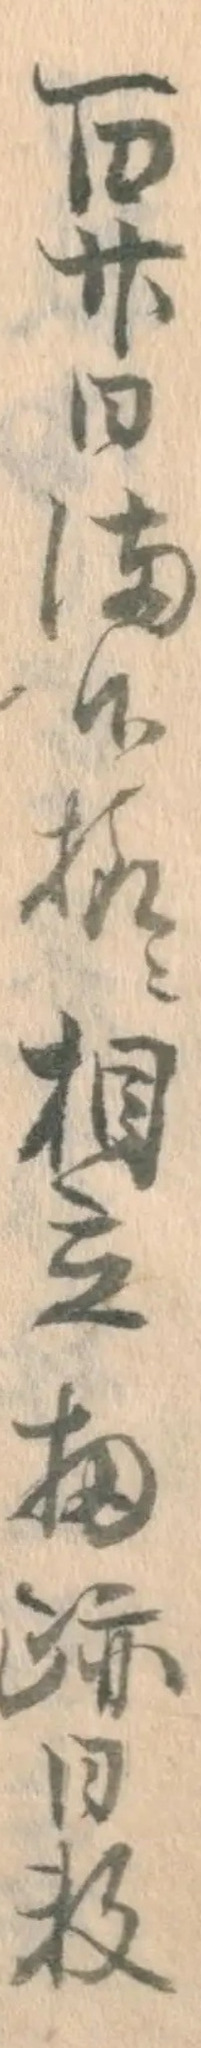百廿日満候様ニ相立扨跡日数
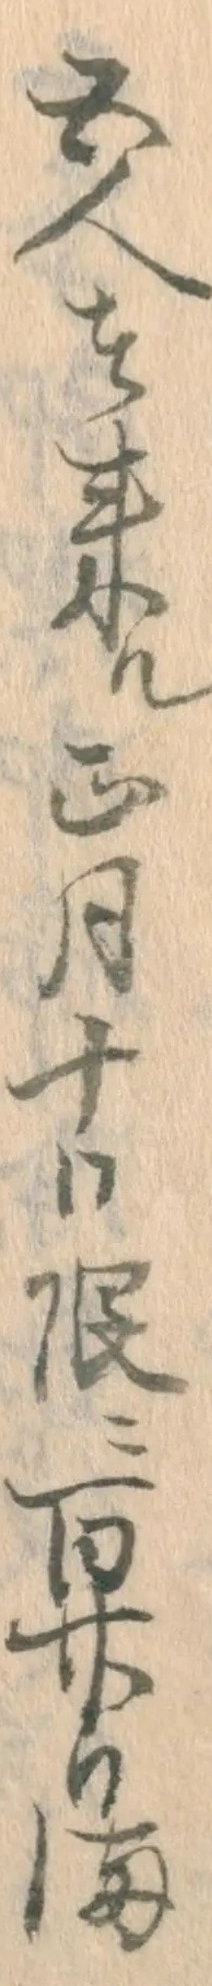五人は来ル正月十日限に百廿日満
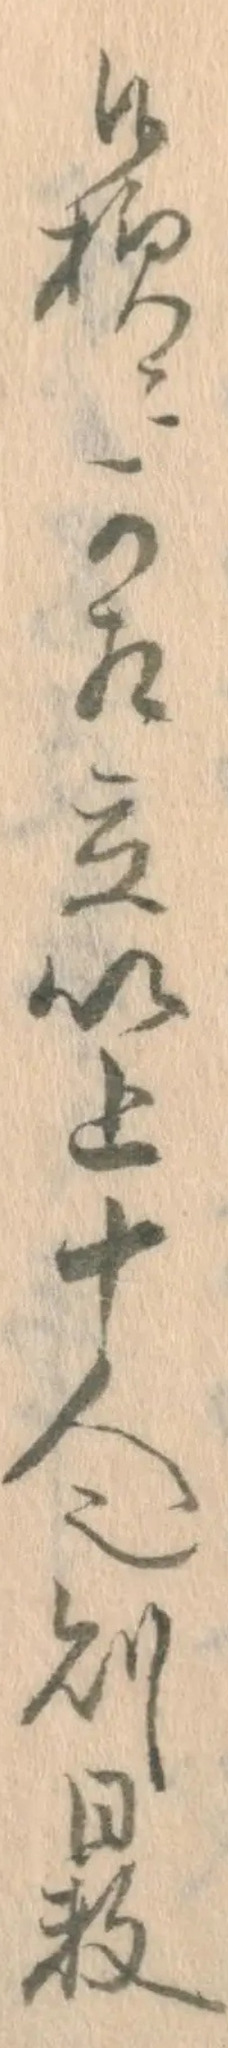候様ニ可相立以上十人也則日数
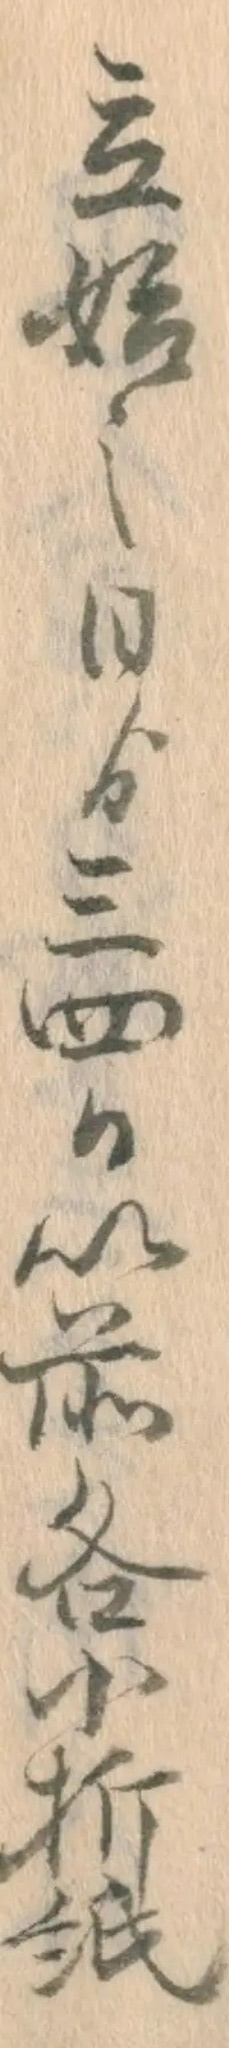立始之日ゟ三四日以前各小折紙
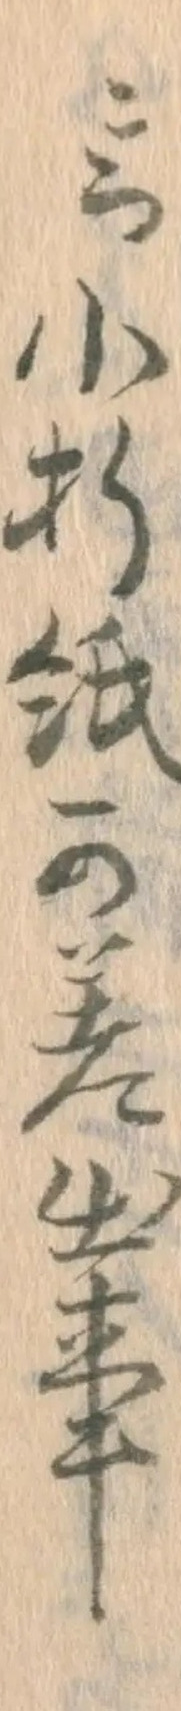ニ而小折紙可差出事
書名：賀茂社記録. 第81冊
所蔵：国立国会図書館 National Diet Library, JAPAN
